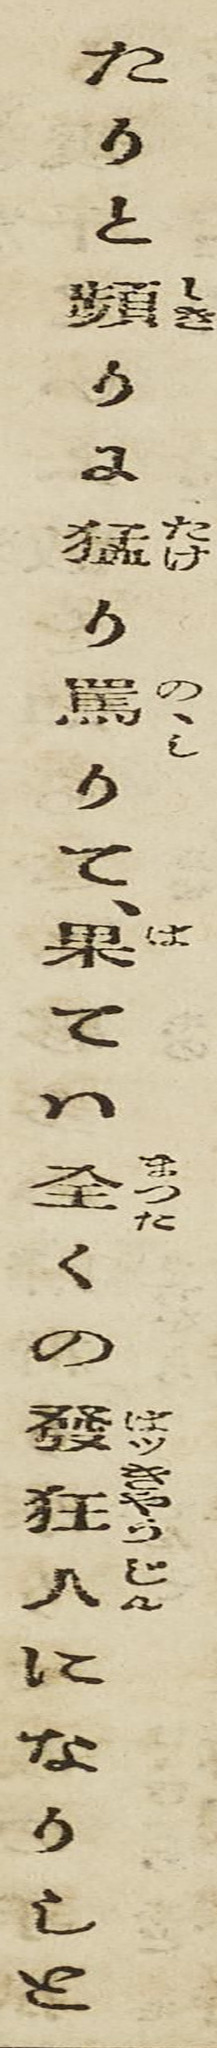たりと頻りに猛り罵りて、果ては全くの発狂人になりしと
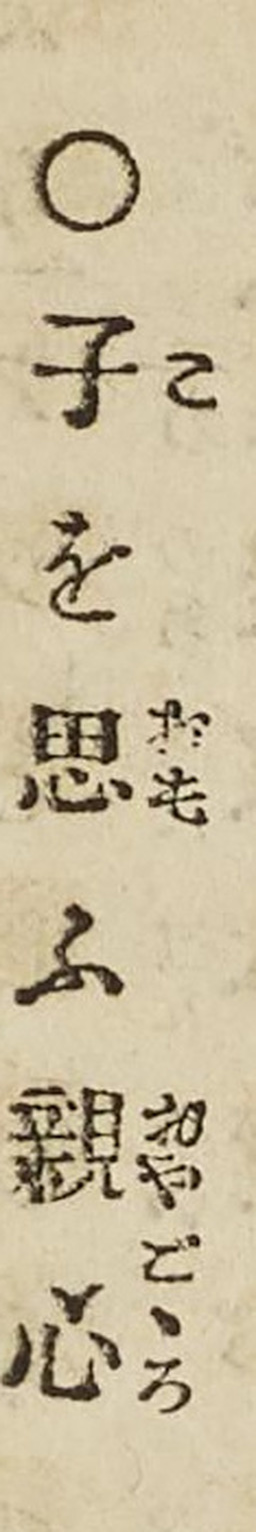○子を思ふ親心
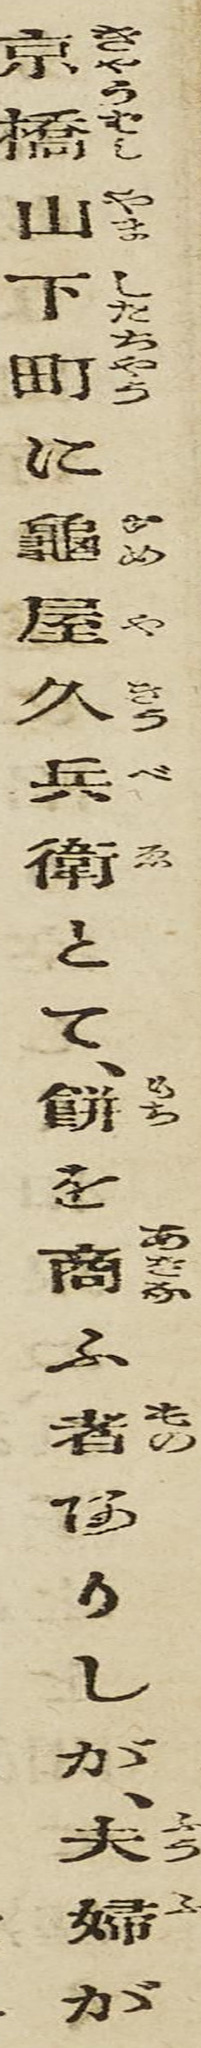京橋山下町に亀屋久兵衛とて、餅を商ふ者なりしが、夫婦が
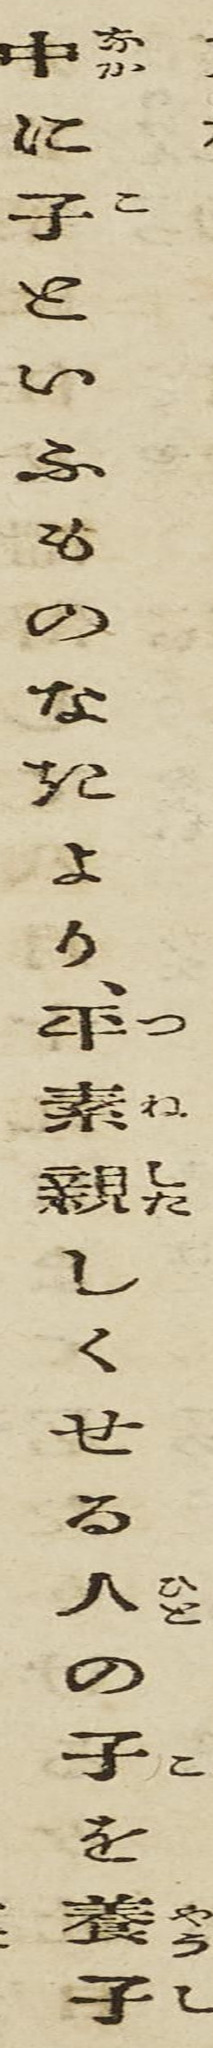中に子といふものなきより、平素親しくせる人の子を養子
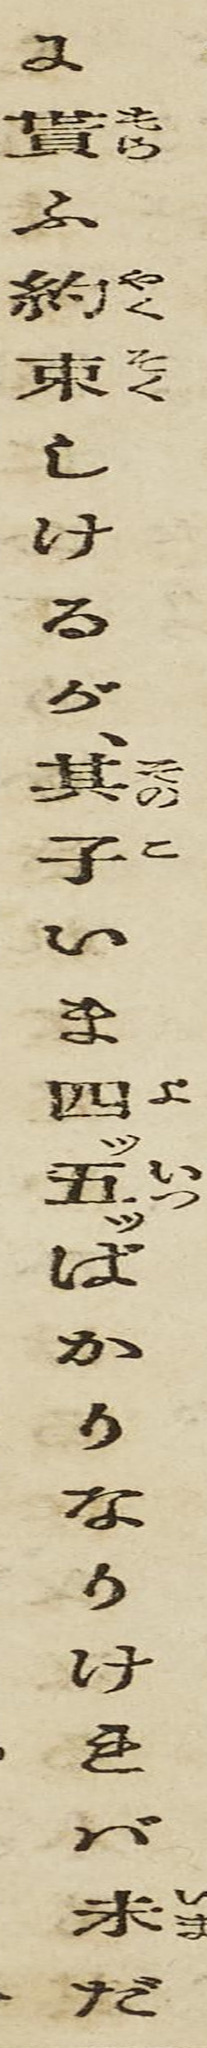に貰ふ約束しけるが、其子いま四ツ五ツばかりなりければ未だ
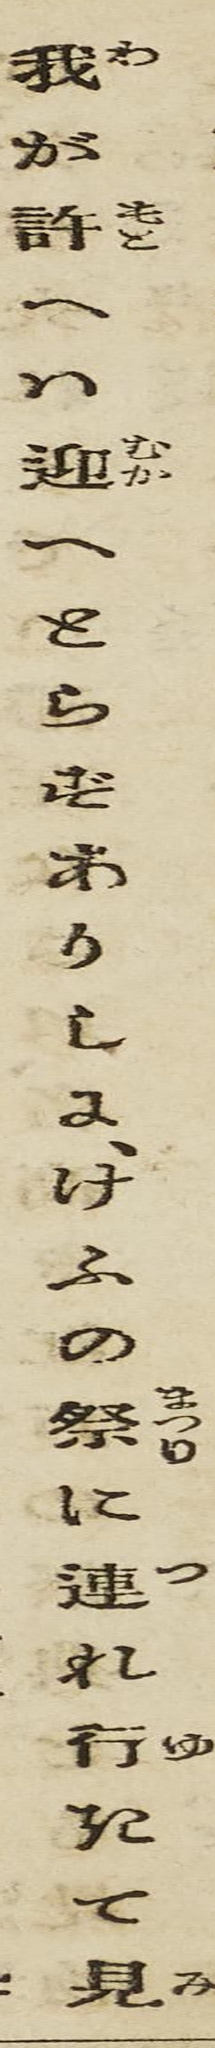我が許へは迎へとらずありしに、けふの祭に連れ行きて見
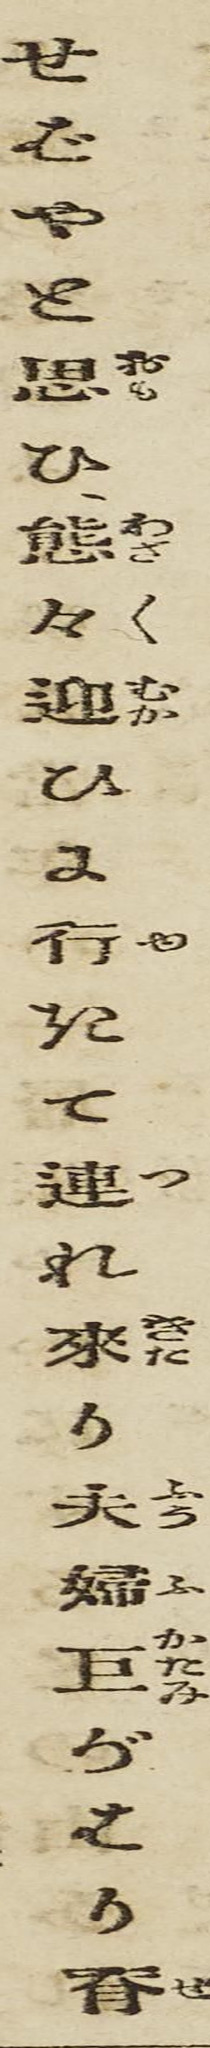せばやと思ひ、態々迎ひに行きて連れ来り夫婦互がはり脊
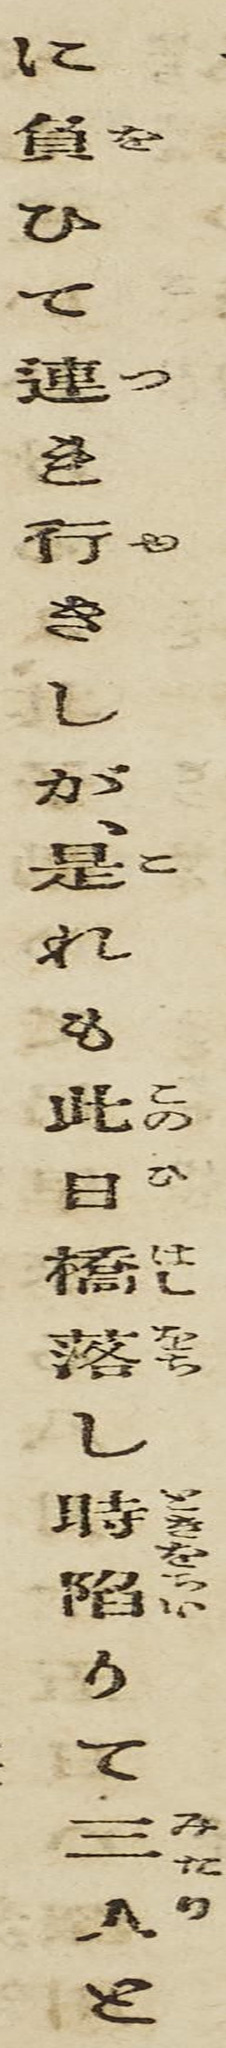に負ひて連れ行きしが、是れも此日橋落し時陥りて三人と
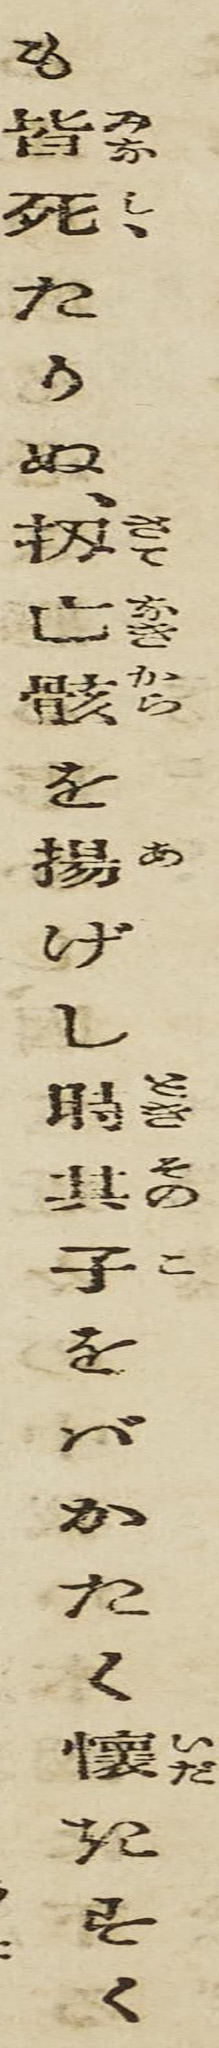も皆死たりぬ、扨亡骸を揚げし時其子をばかたく懐きすく
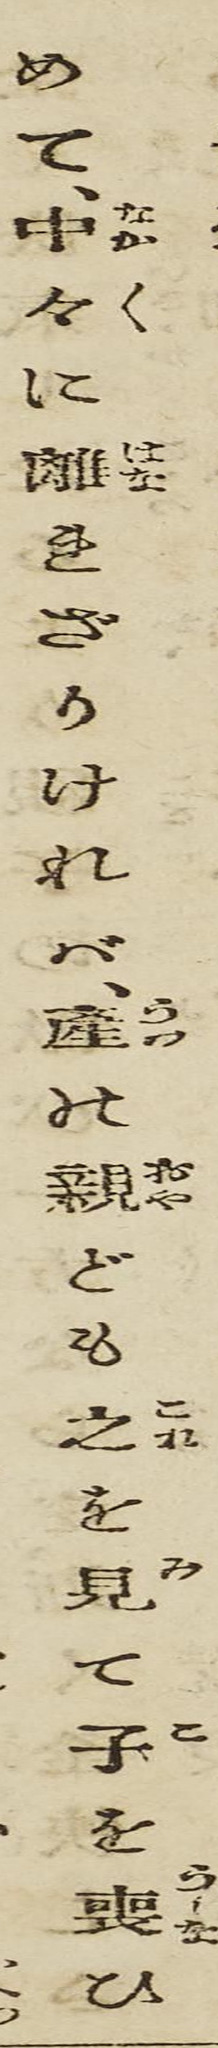めて、中々に離れざりければ、産の親ども之を見て子を喪ひ
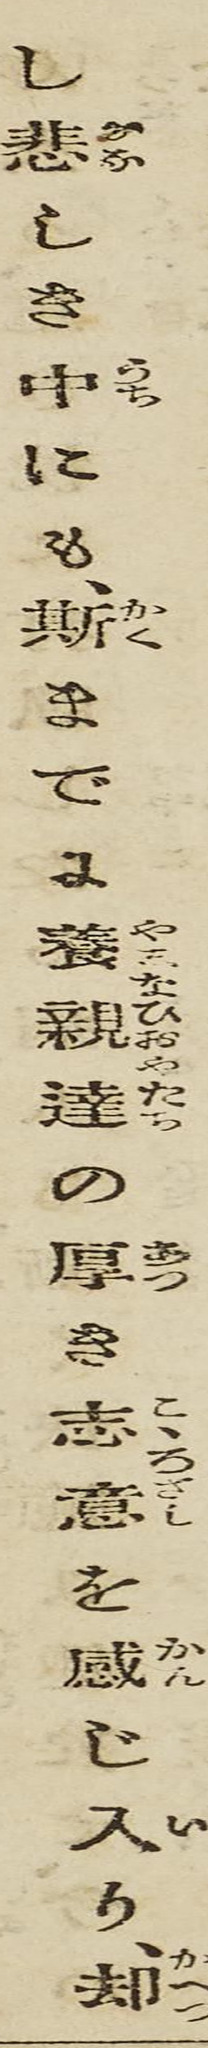し悲しき中にも、斯までに養親達の厚き志意を感じ入り、却
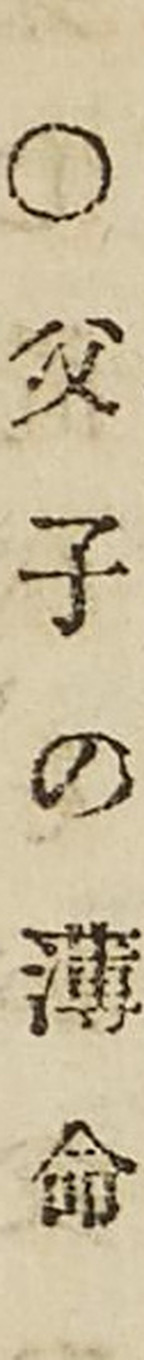○父子の薄命
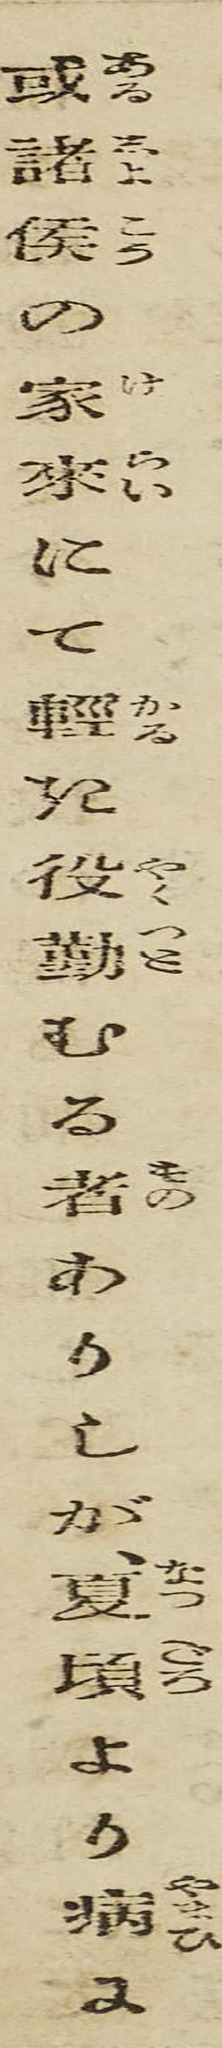或諸侯の家来にて軽き役勤むる者ありしが、夏頃より病に

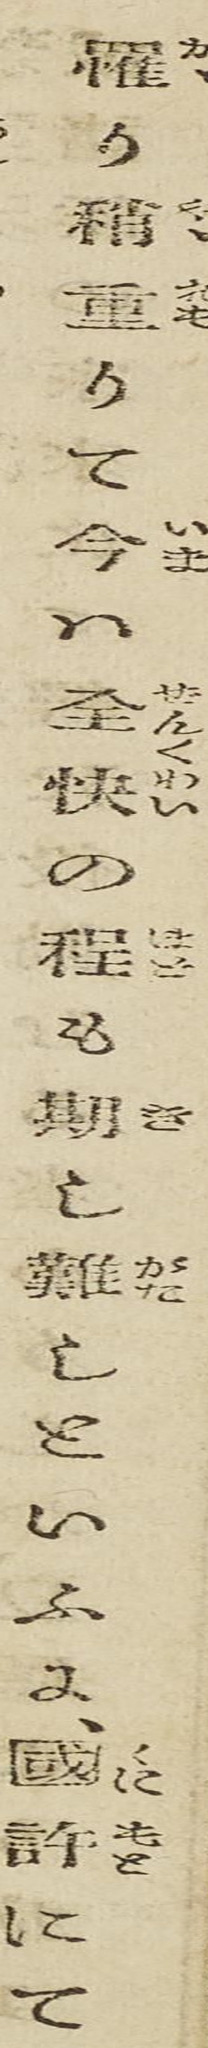罹り稍重りて今は全快の程も期し難しといふに、国許にて
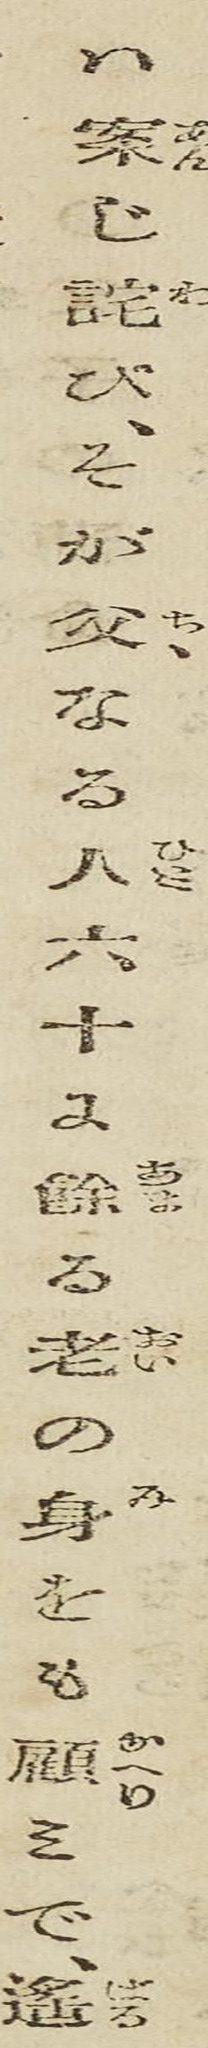は案じ詫び、そが父なる人六十に余る老の身をも顧みで、遥
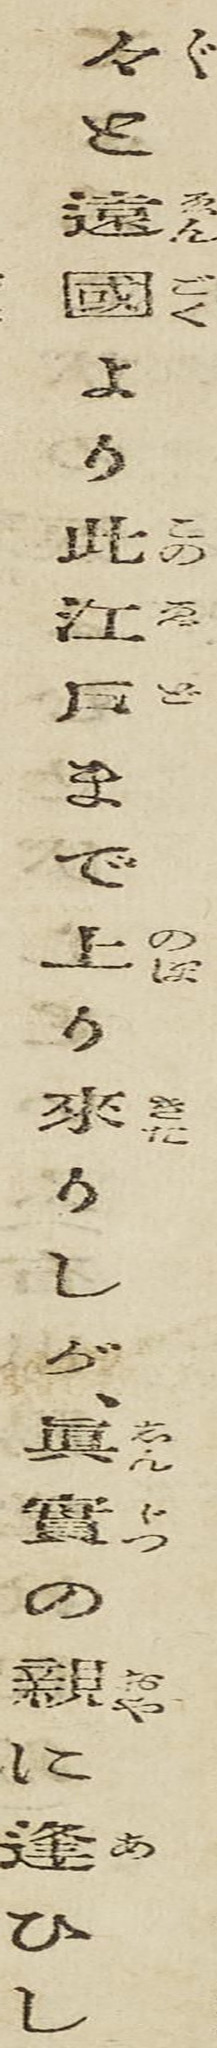々と遠国より此江戸まで上り来りしが、真実の親に逢ひし
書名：永代惨話　文化の夢　全
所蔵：東京大学地震研究所図書室 Earthquake Research Institute Library, The University of Tokyo, JAPAN
